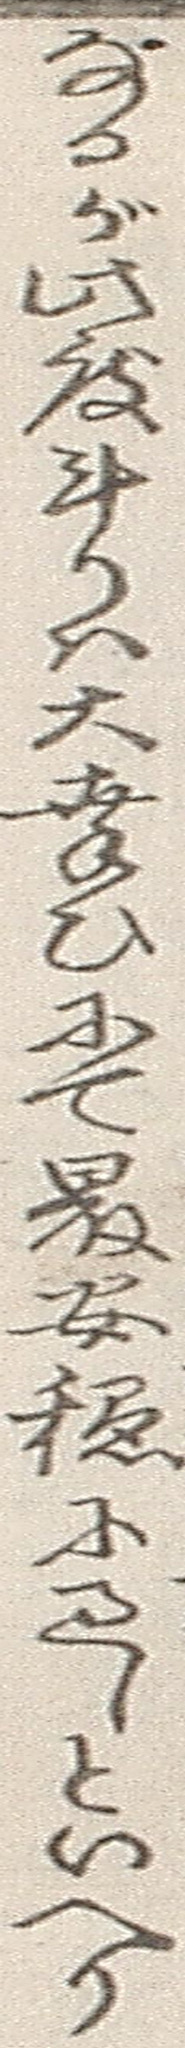なるが此度斗りハ大幸ひにて最安穏に過しといへり
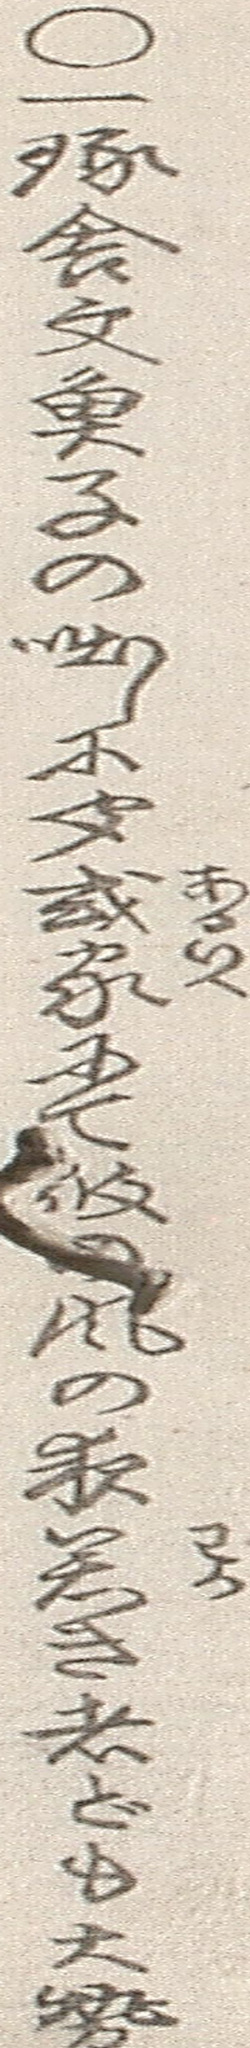◯一琢舎文魚子の咄しに聞或家にて彼の風の夜若き者ども大勢
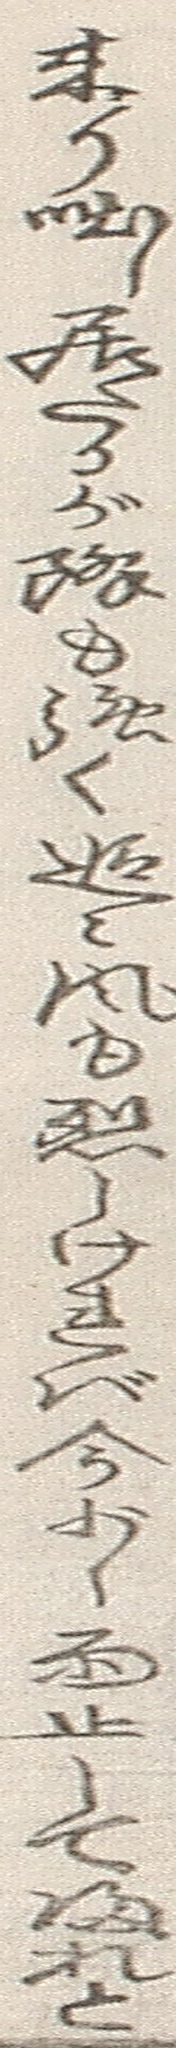来り咄し居たるが降も強く追々風も烈しけれバ今少々雨止して帰れと
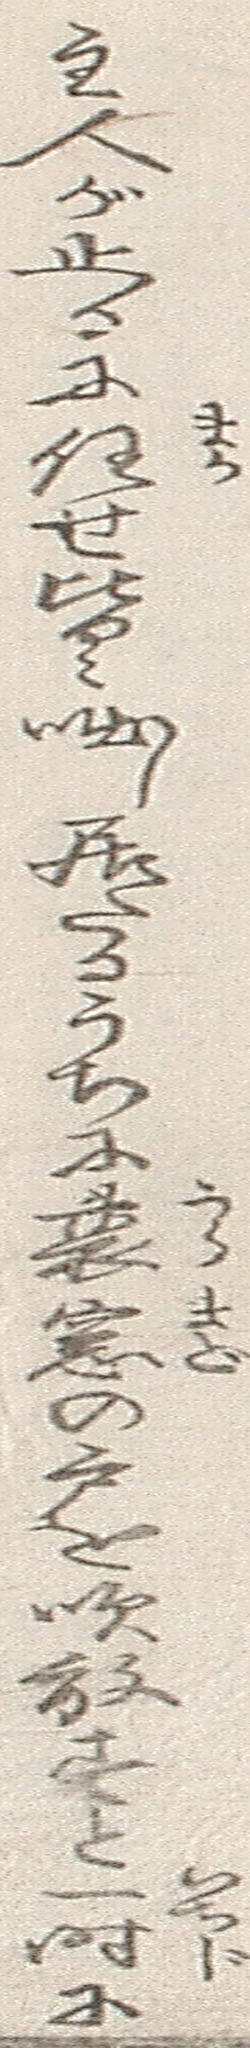主人が止るに任せ皆々咄し居たるうちに裏窓の戸を吹放すと一時に
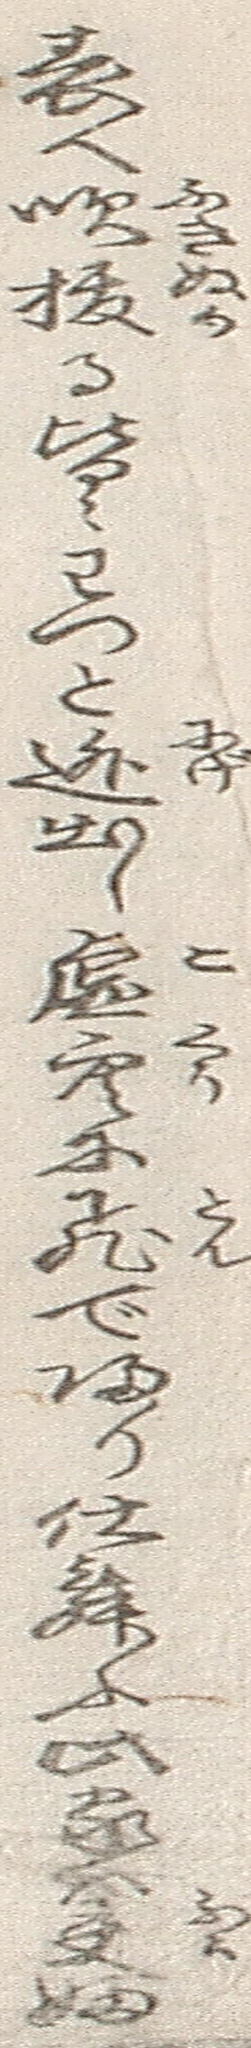表へ吹抜る皆々わつと逃出し虚空に飛で帰り仕舞ふ此家ハ夫婦
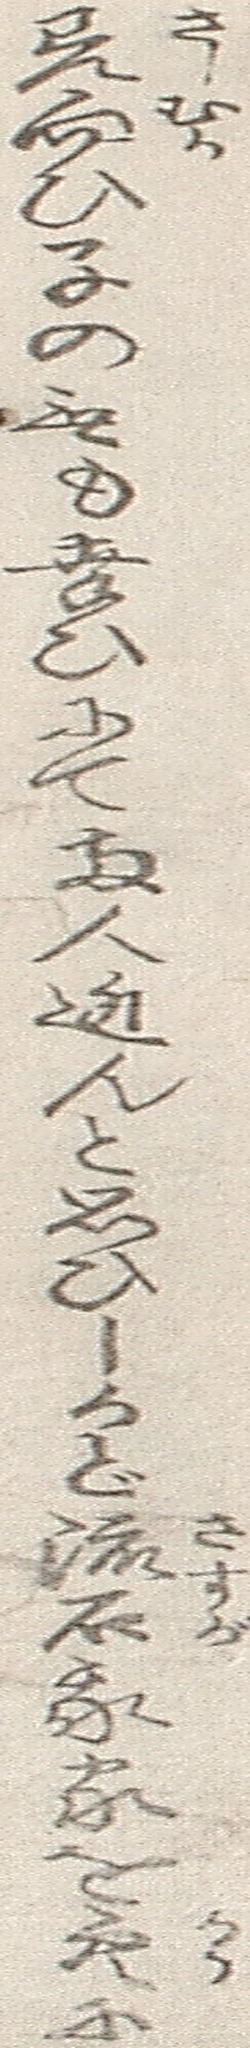差向ひ子の無も幸ひにて両人逃んと思ひしかど流石我家を空に
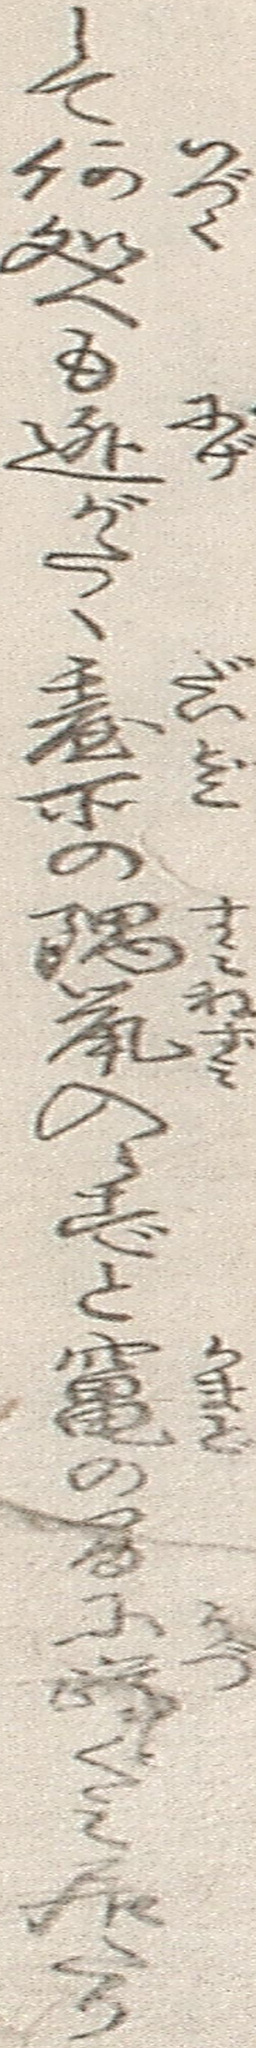して何処へも逃がたく台所の隅鼠入らずと竈の間に蹲くミ居たり
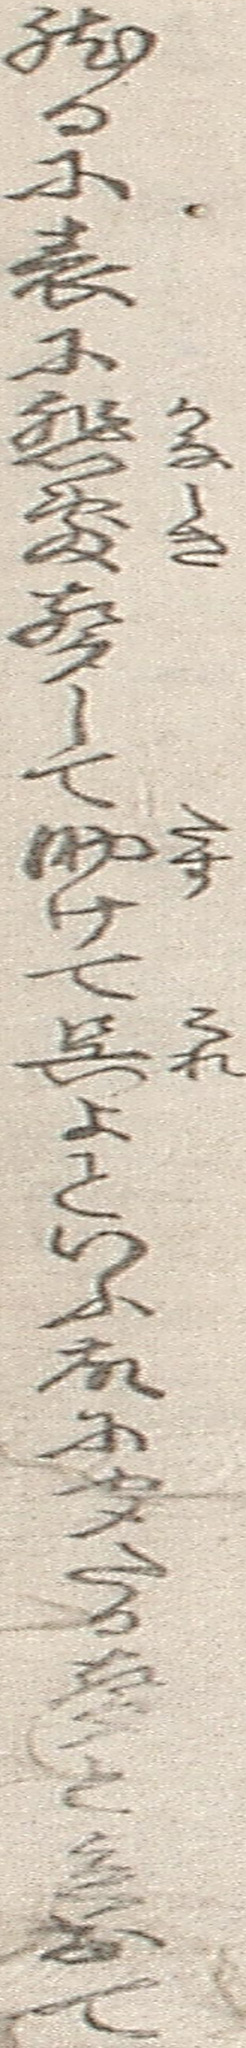然るに表に悲敷声して助けて呉よといふ故に聞たる声と立出て

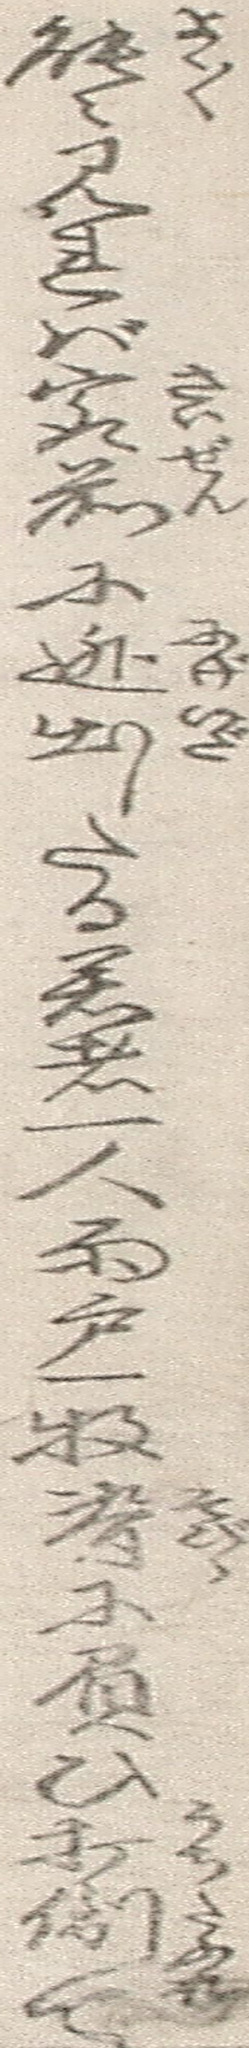能々見れバ最前に逃出したる若者一人雨戸一枚背に負ひ打倒て
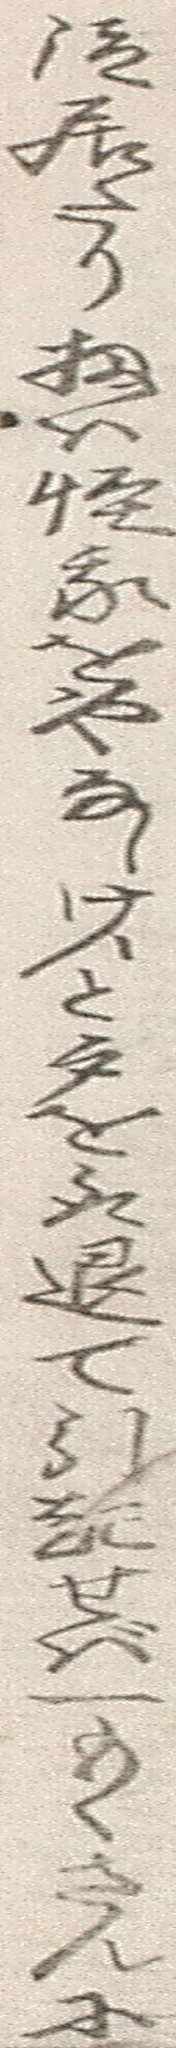泣居たり扨ハ怪我をやなしけんと戸を取退て引起せバ一もくさんに
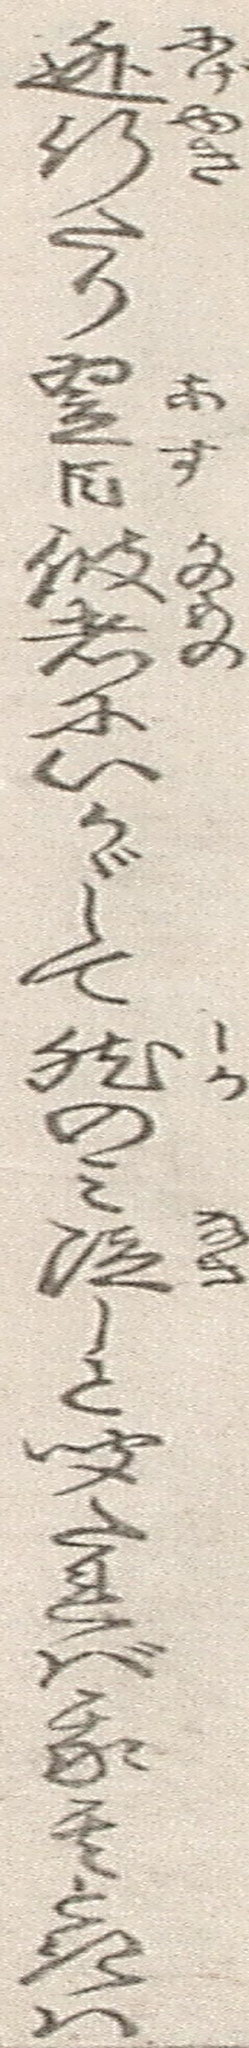逃行たり翌日彼者にいかゞして然のミ泣しと聞たれバ我其ときハ
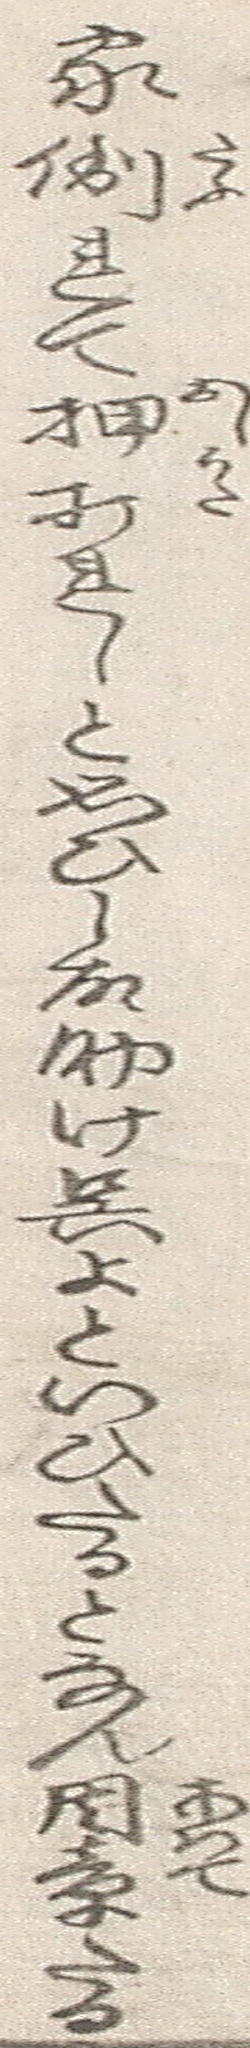家倒れて押打れしと思ひし故助け呉よといひたるとなん周章たる
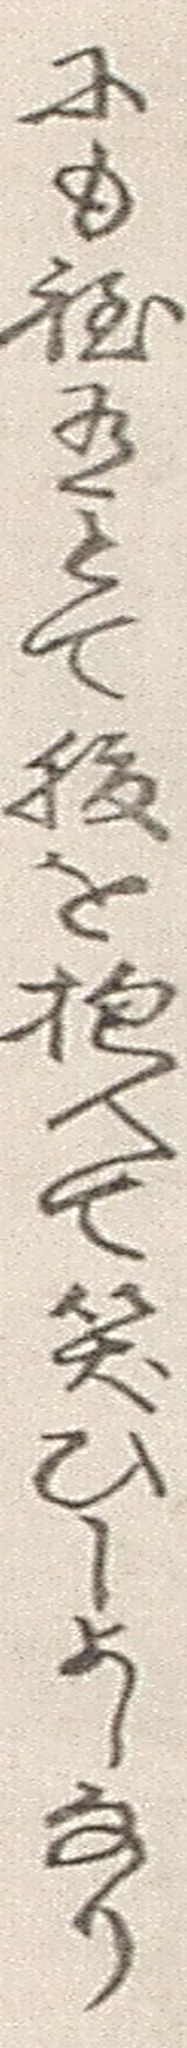にも程有とて腹を抱へて笑ひしよしなり
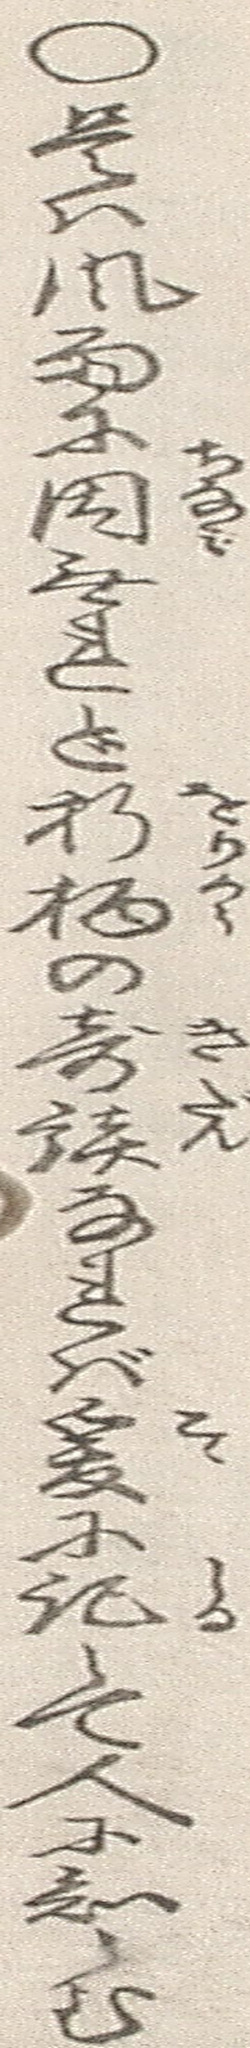◯是ハ風雨に因無れど折柄の奇談なれバ爰に記して人に知しむ
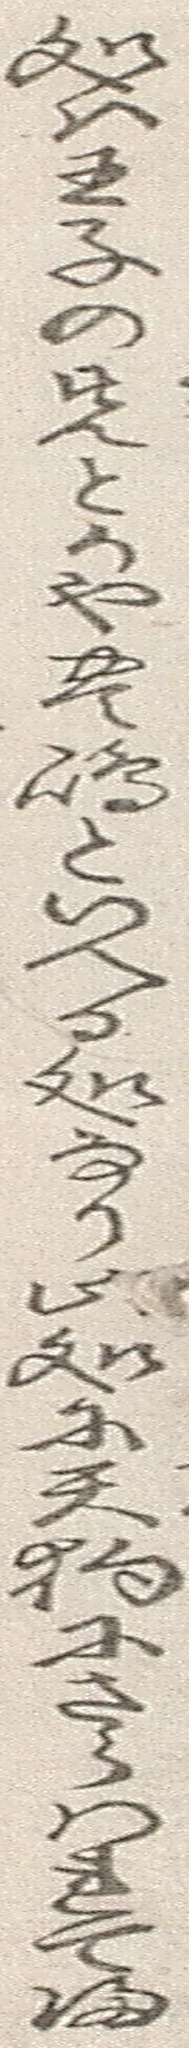処ハ王子の先とかや豊島といへる処なり此処に天狗にさらハれて帰
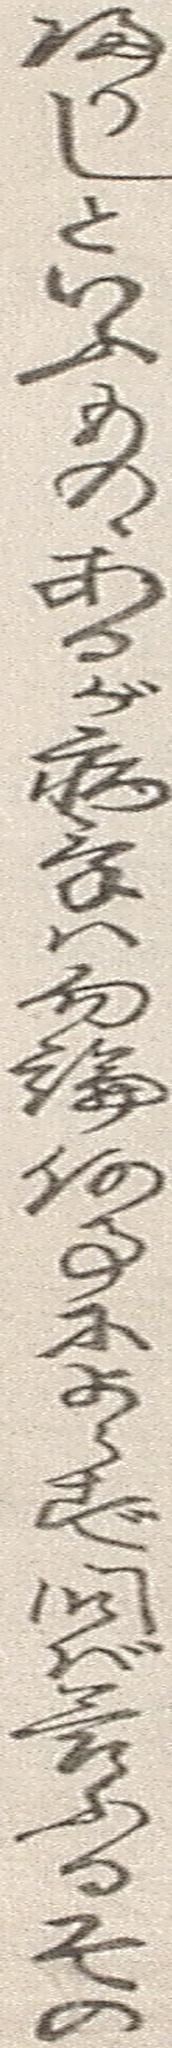帰りしといふものゝあるが病気ハ勿論何事によらず問バ答ふるその
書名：安政風聞集　上中下　全
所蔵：東京大学地震研究所図書室 Earthquake Research Institute Library, The University of Tokyo, JAPAN
